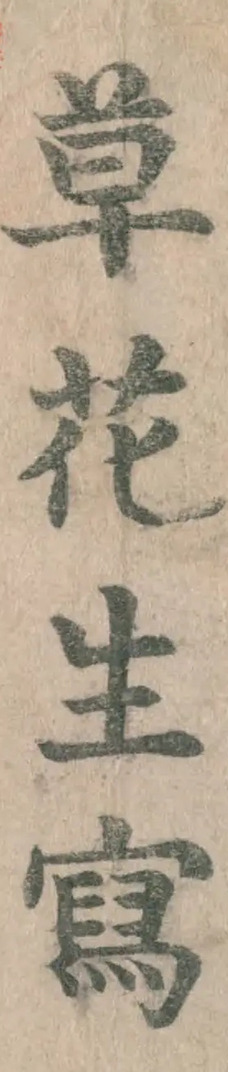草花生写
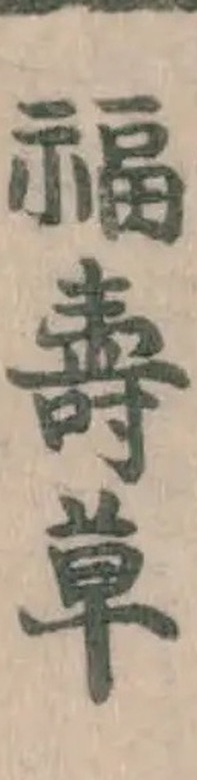福寿草
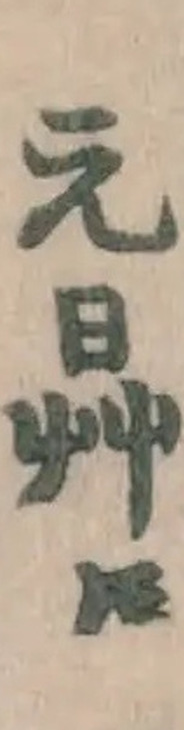元日艸口
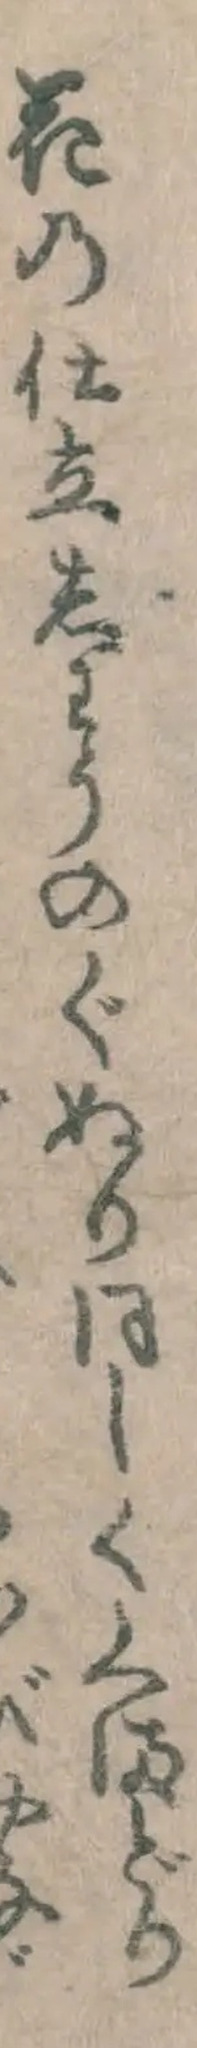花の仕立しわうのぐぬり同しくくまどり
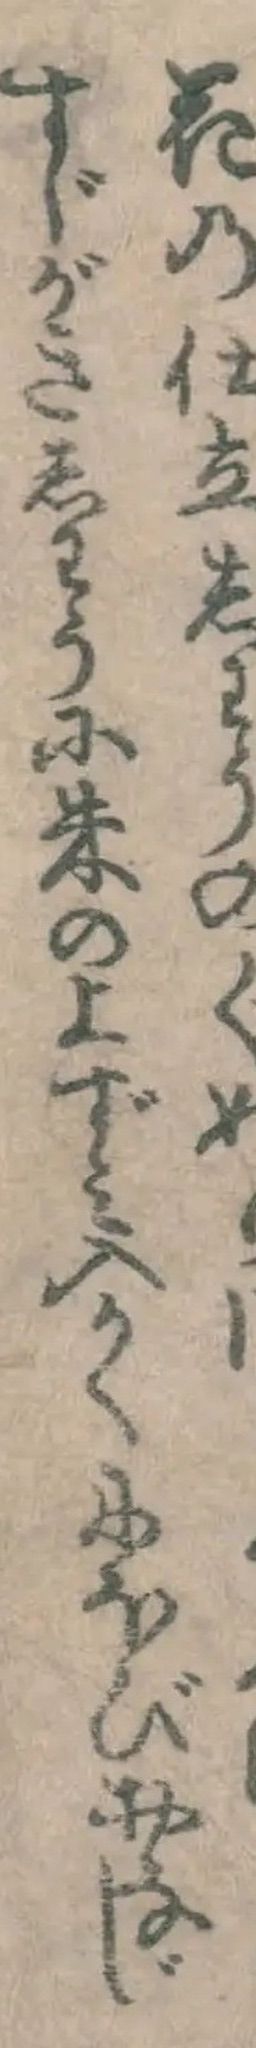すじがきしわうに朱の上ずみ入かくにほびおなじ

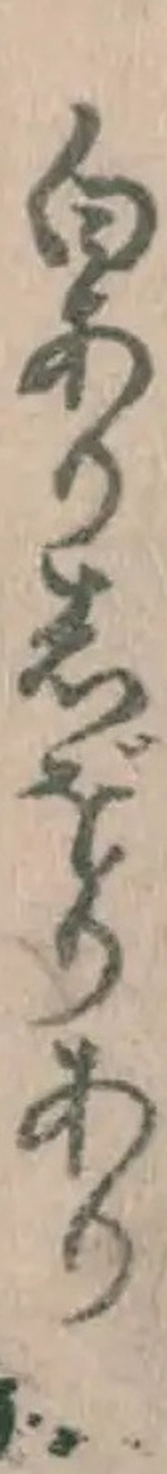白ありしぼりあり
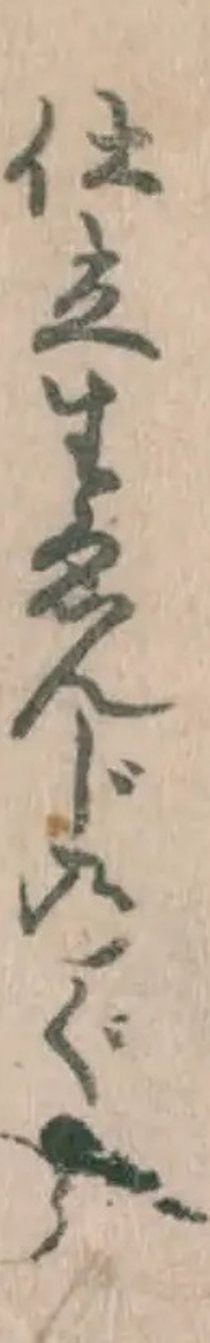仕立生ゑんじのぐ
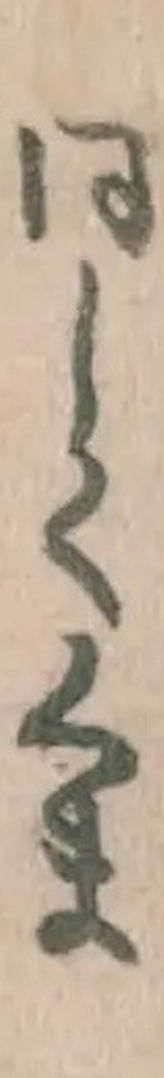同しくくま
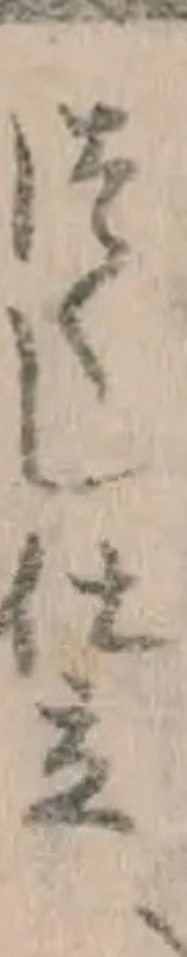つくし仕立
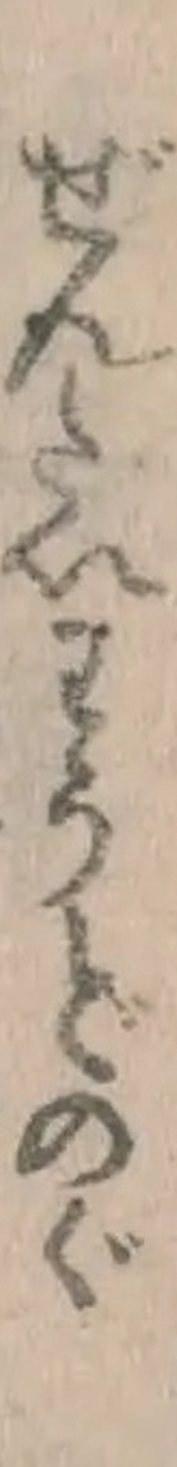ぜんたいわうどのぐ
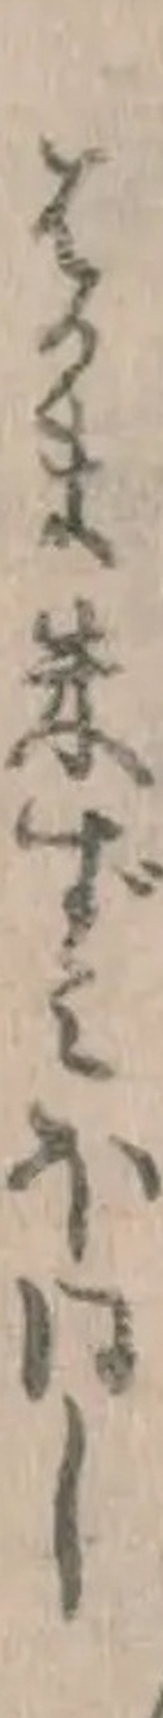はかま朱ずみほほし
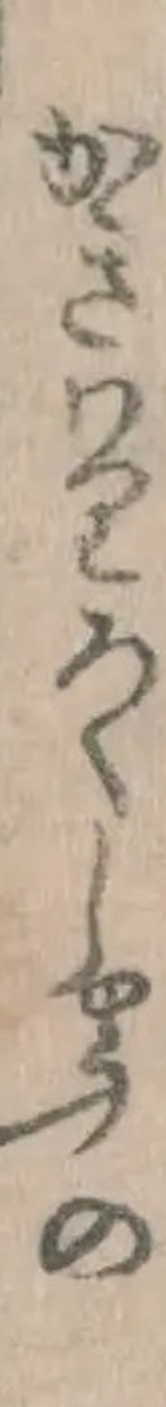かきわりろくしやうの
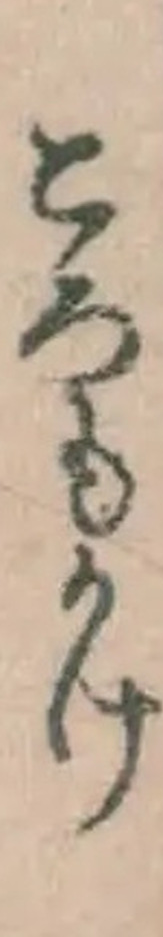ころもかけ
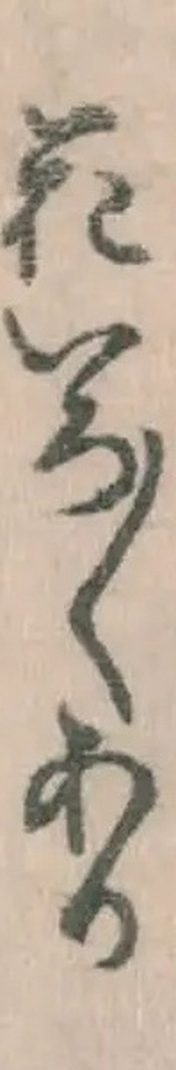花いろ〳〵あり
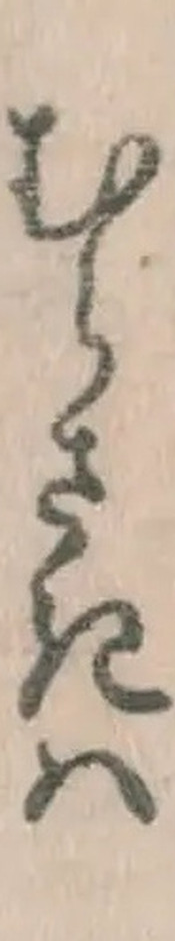むらさきは
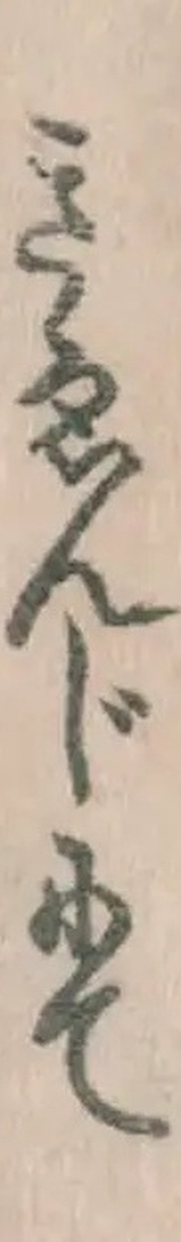きゑんじにて
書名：絵本時津艸
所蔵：国立国会図書館 National Diet Library, JAPAN
